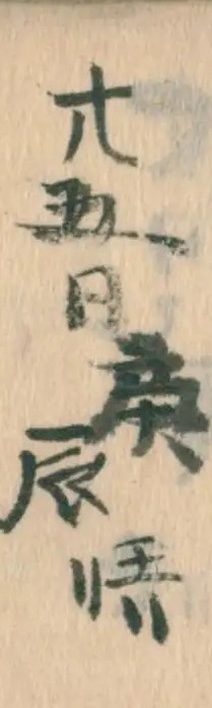廿五日庚辰晴
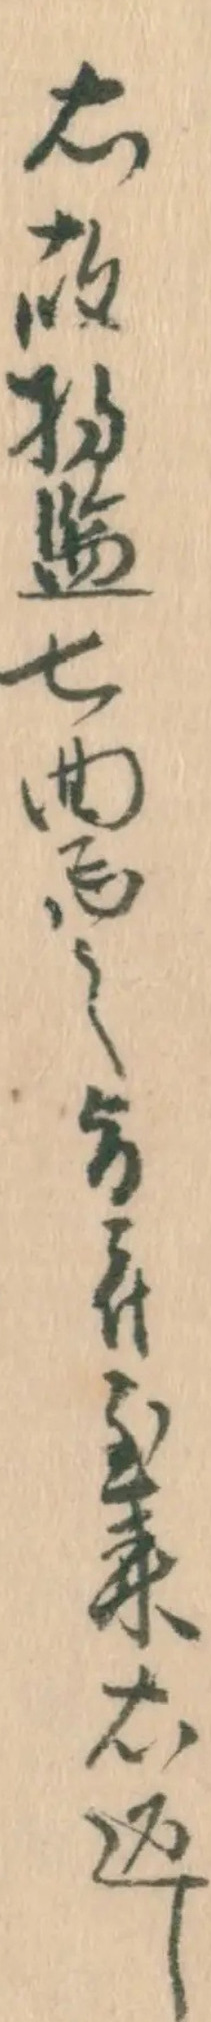右故将監七回忌之旨ニ付到来右返し
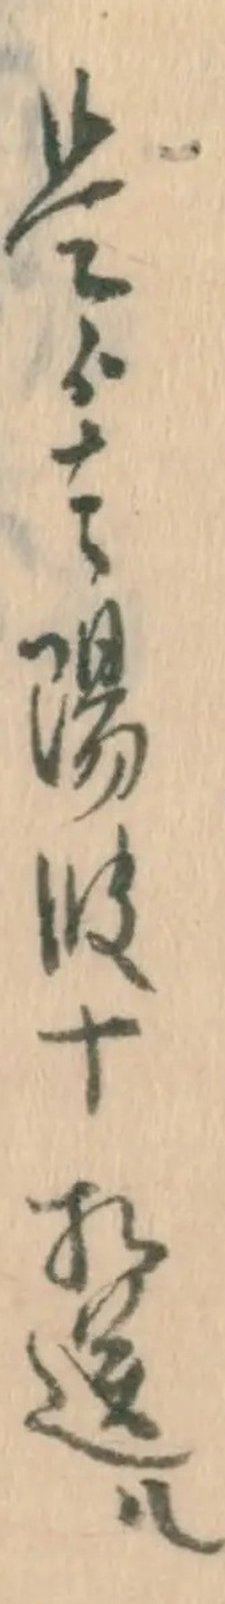是ゟは陽波十相送ル
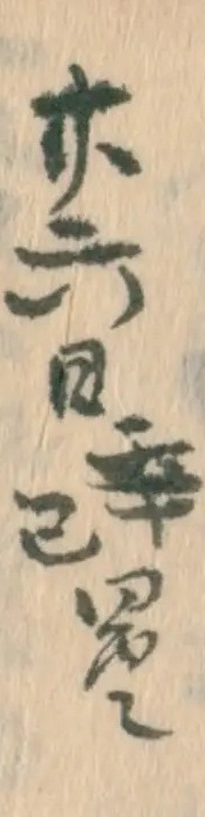廿六日辛巳曇
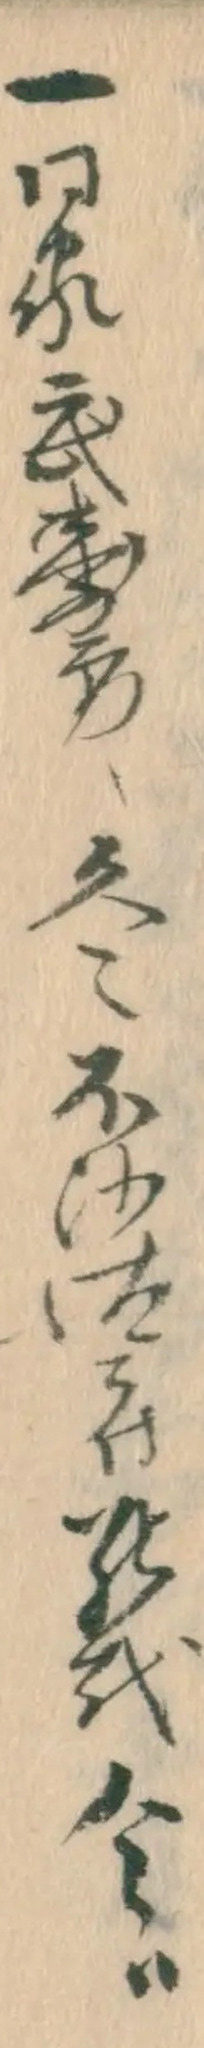一同家武寿方へ久々不沙汰ニ付罷越今日
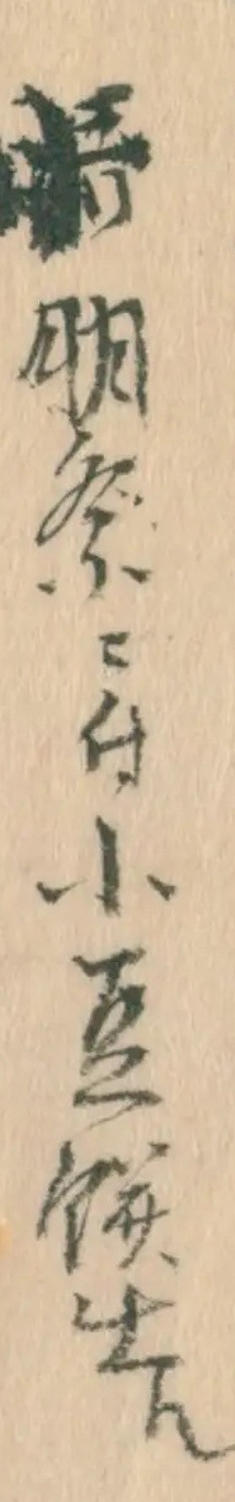晴明祭ニ付小豆餅出ル
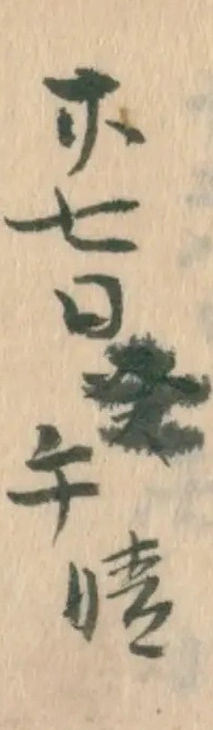廿七日壬午晴
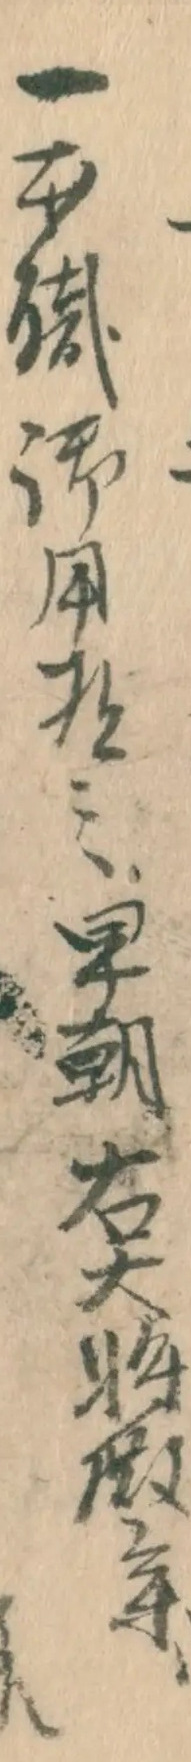一本職御用為之早朝右大将殿参ル
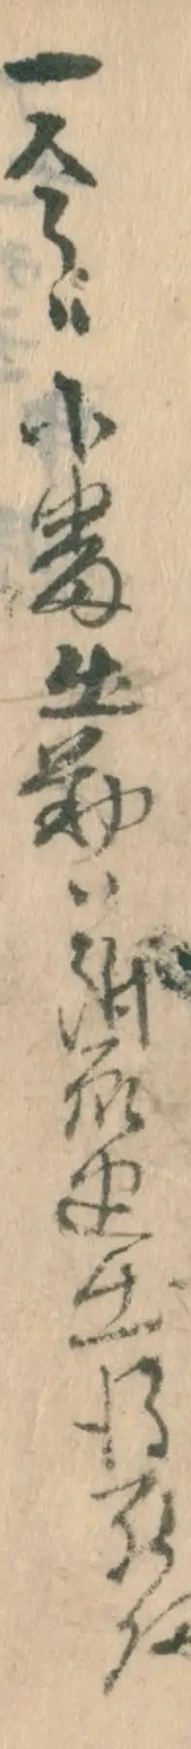一今日小番出勤御附衆退出後罷帰ル

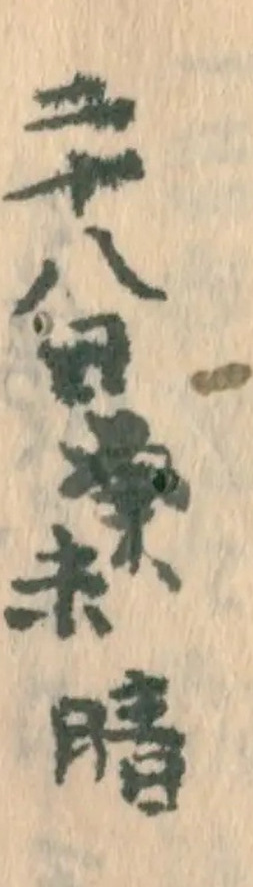二十八日癸未晴
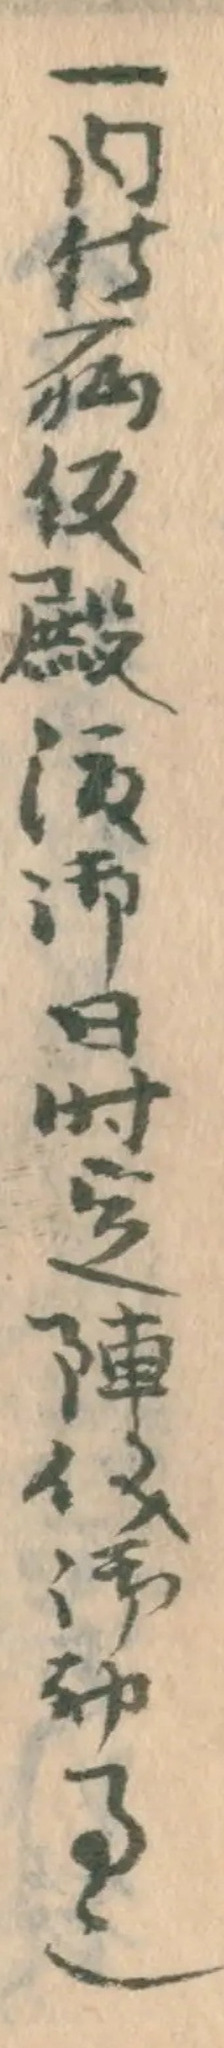一内侍所仮殿渡御日時定陣儀御神事也
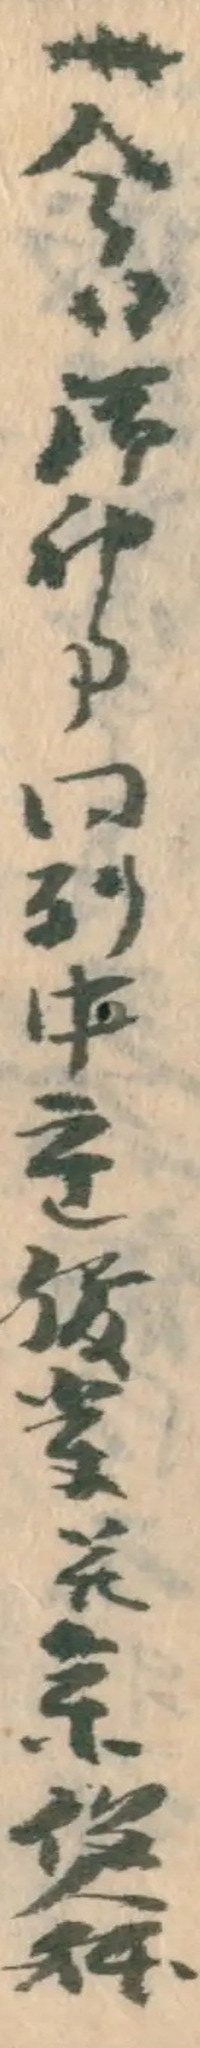一今日御神事同列中重腹輩并参役人体
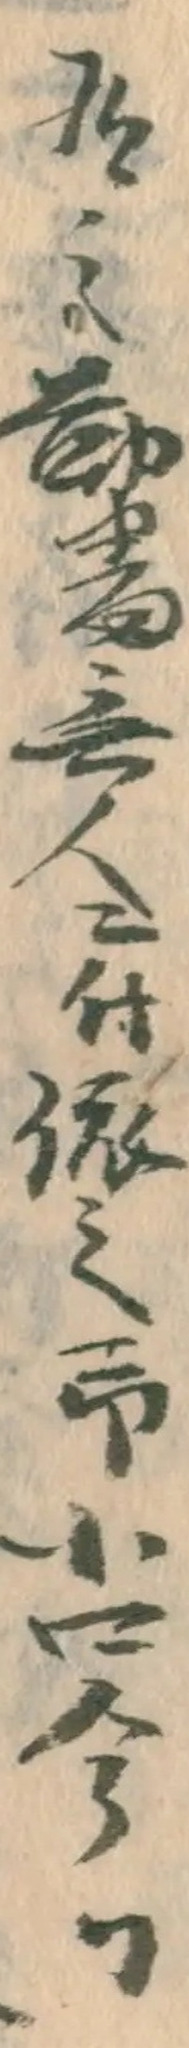為之勤番無人ニ付依之予小口今日
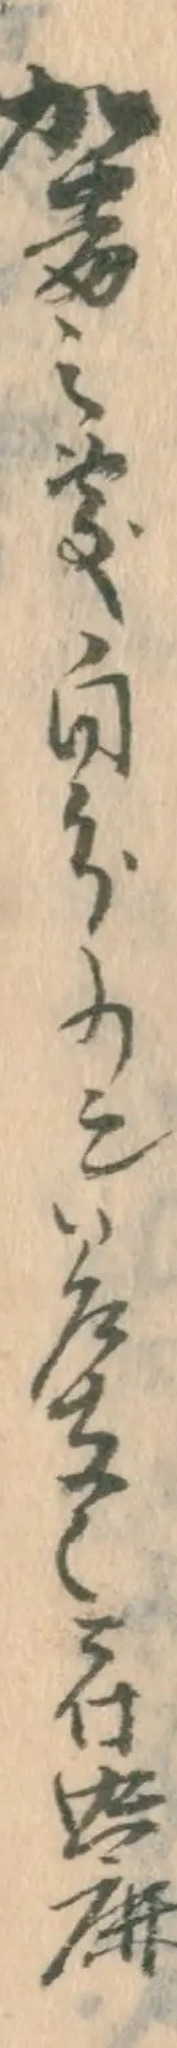加番之処自分少シ差支之ニ付虫鹿
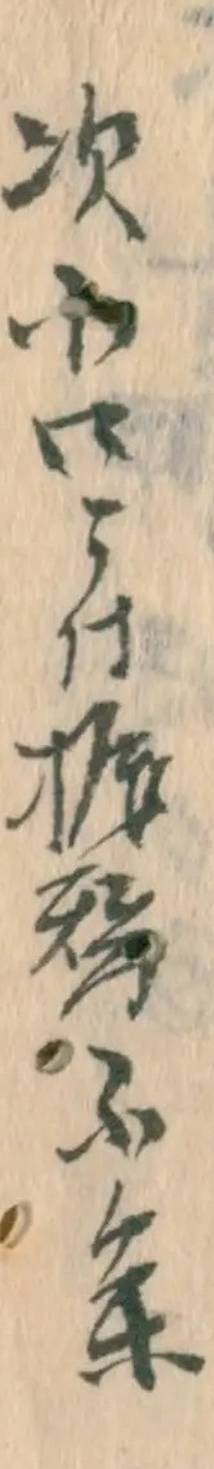次小口ニ付振替不参
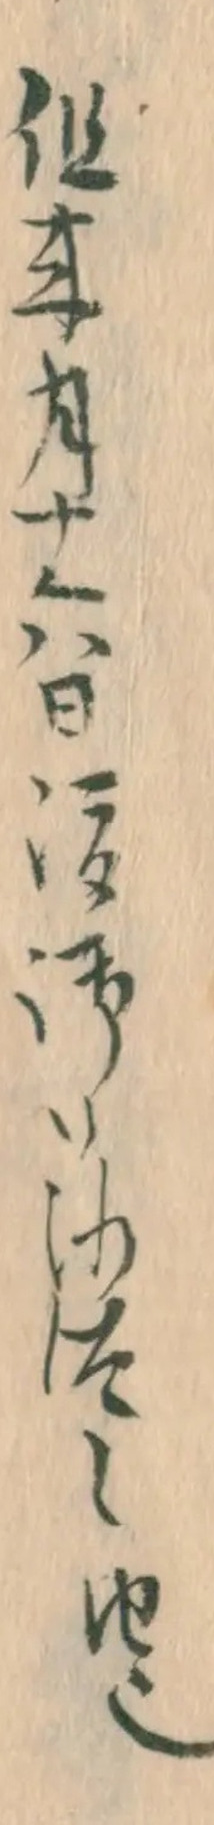但来月十六日渡御御沙汰之由也
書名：禁裏御所御用日記. [131]
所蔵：国立国会図書館 National Diet Library, JAPAN
